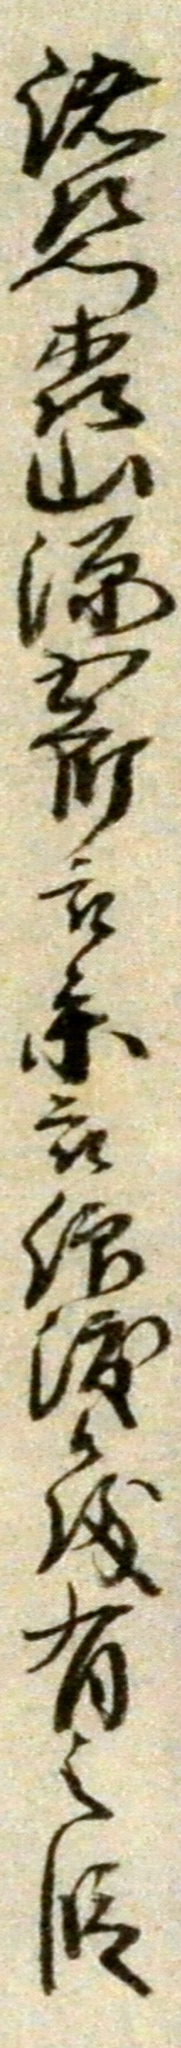諸左衛門森山源五郎被参被仰渡候儀有之段
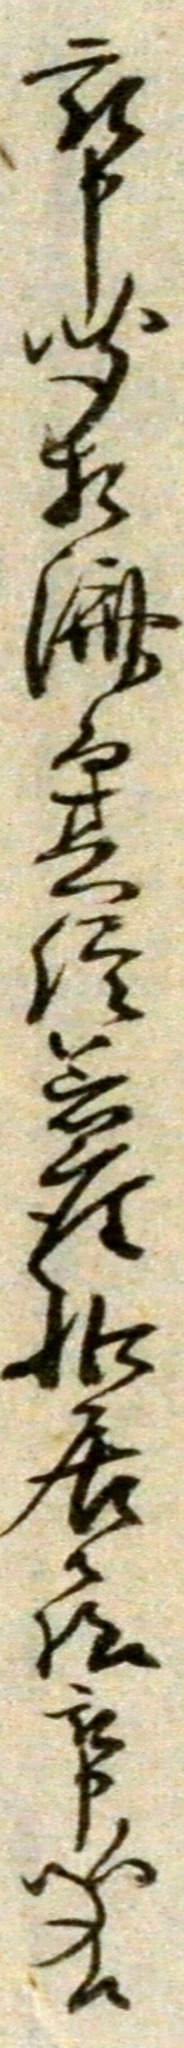被申聞相済而其侭着座扣居候様被申聞候
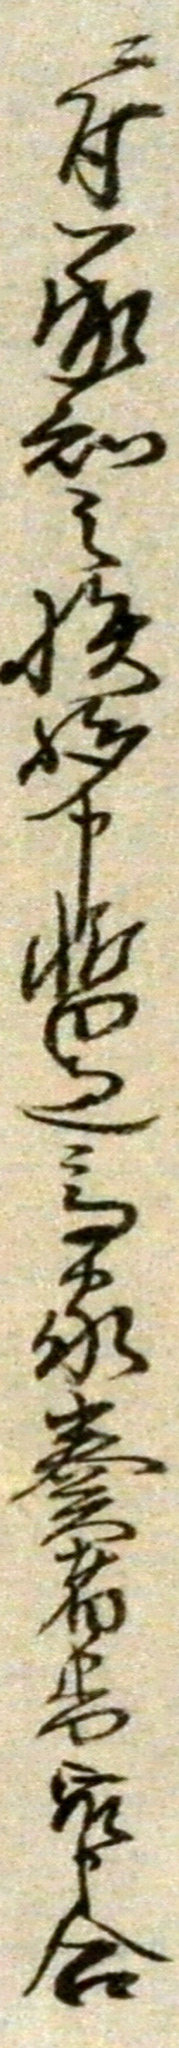ニ付承知之挨拶申暫過高家奏者番衆申合
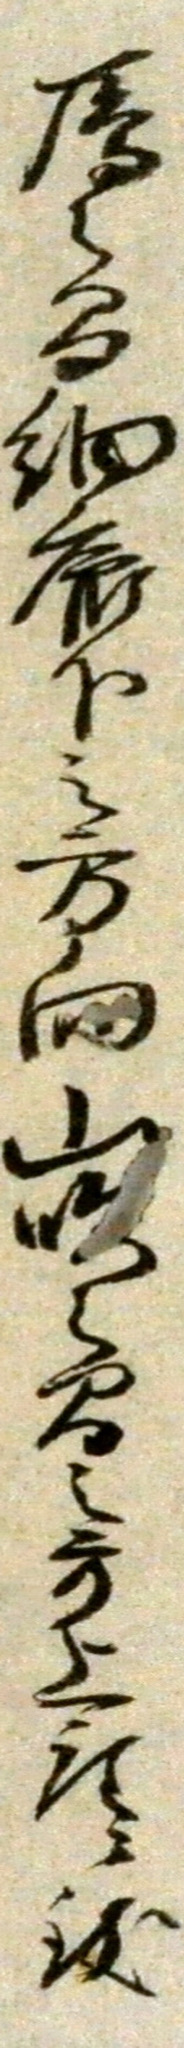雁之間細廊下之方向山吹之間之方上座ニ致
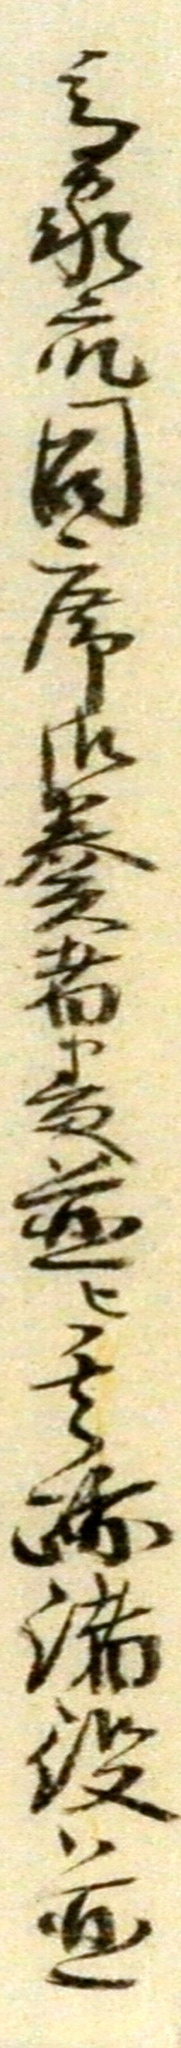高家衆同席御奏者番並ヒ其跡諸役並
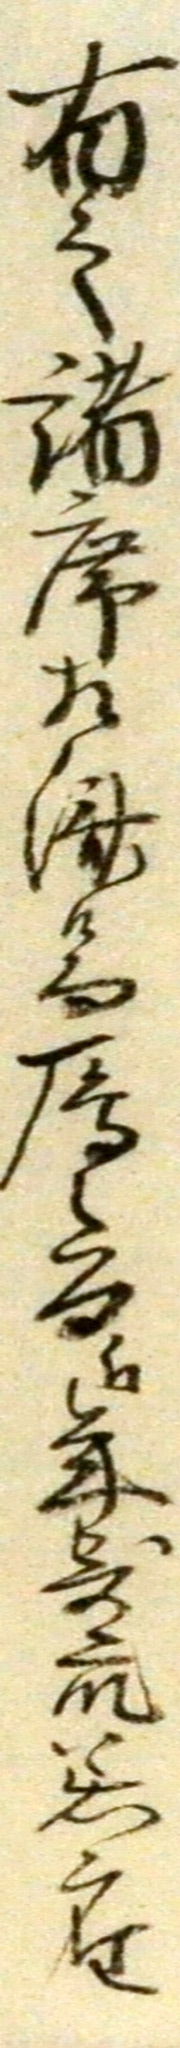有之諸席相済候而雁之間え年寄衆着座

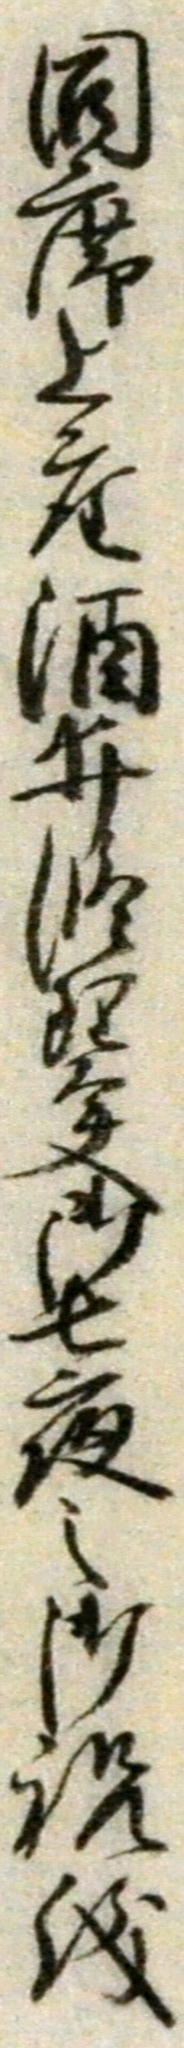同席上座酒井修理大夫御七夜之御祝儀
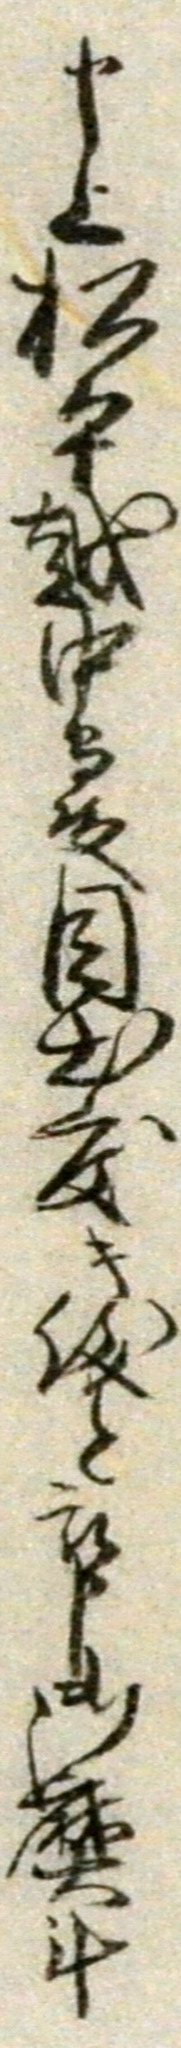申上松平越中守殿目出度キ儀と被申御熨斗
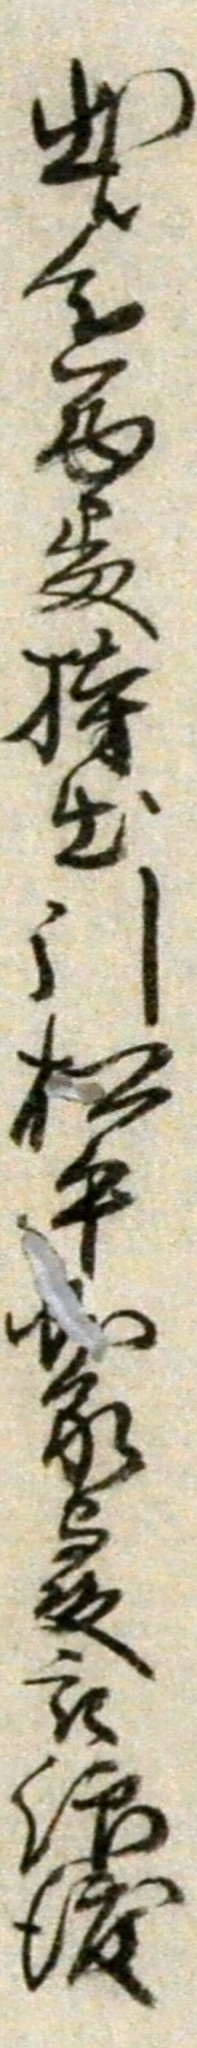出ル近習番持出引松平和泉守殿被仰渡
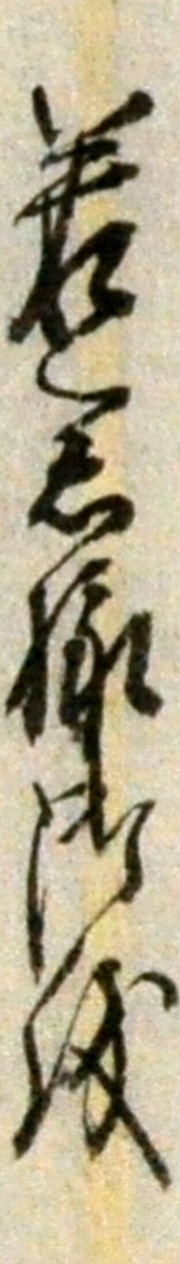若君様御儀
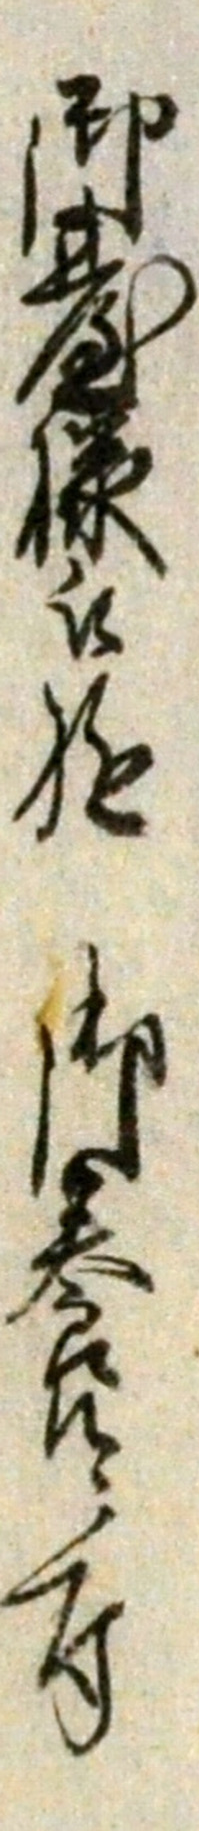御臺様被遊御養候ニ付
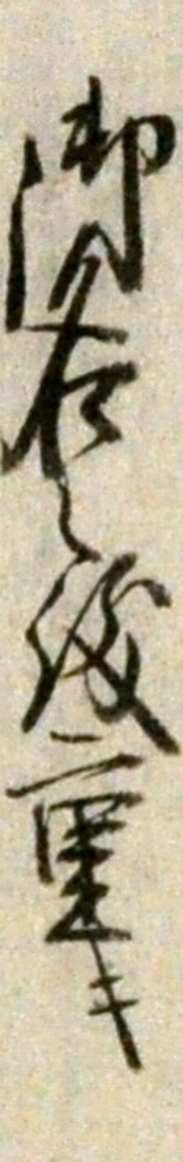御名之儀重キ
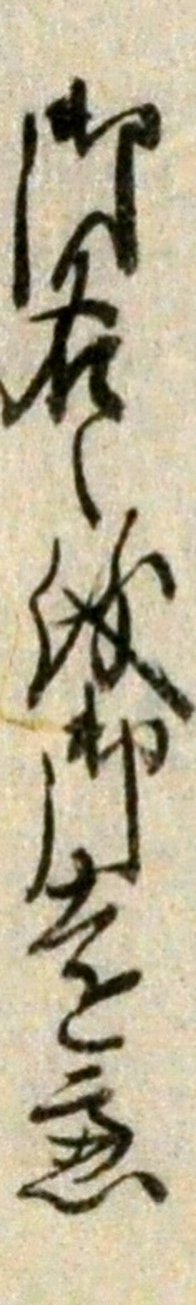御名之儀御遠慮
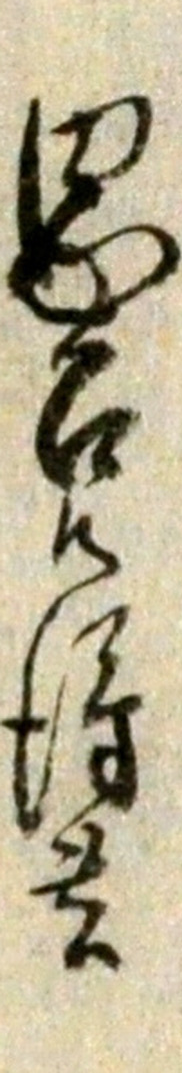思召候得共
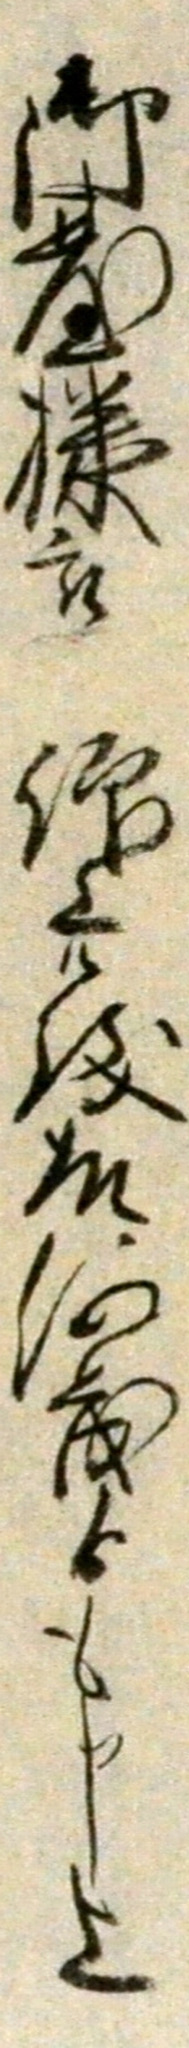御臺様被仰上ル儀候故何もゟも申上
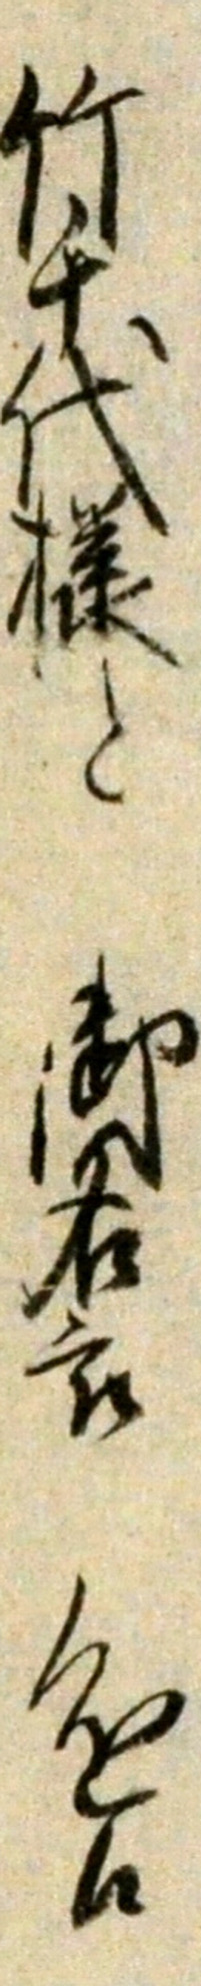竹千代様と御名被進候
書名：若君様（家斉嫡男）誕生諸祝儀ノ節ノ留書外
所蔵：伊那市立高遠町図書館・合同会社AMANE
